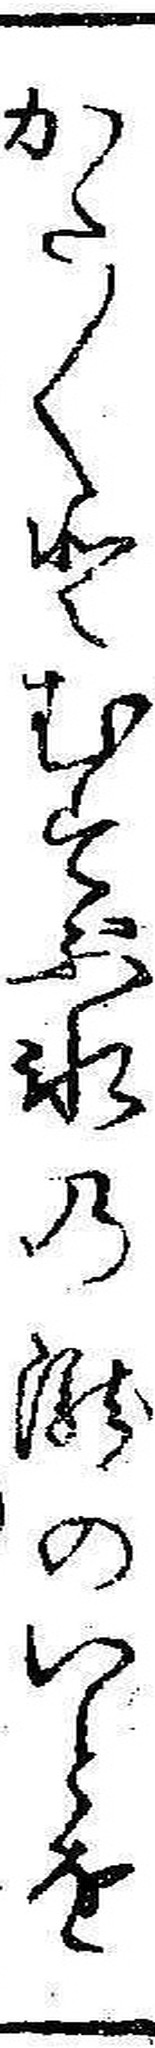かた〳〵とむすぶ氷の瀧のいとを
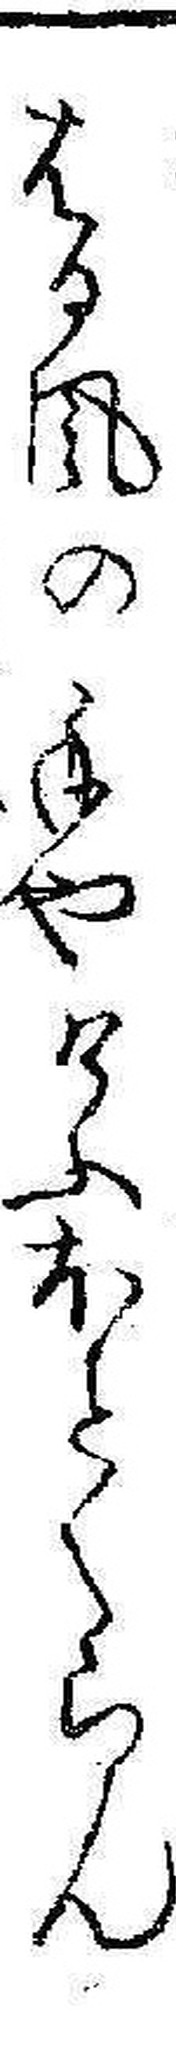はる風の手やけふほとくらん
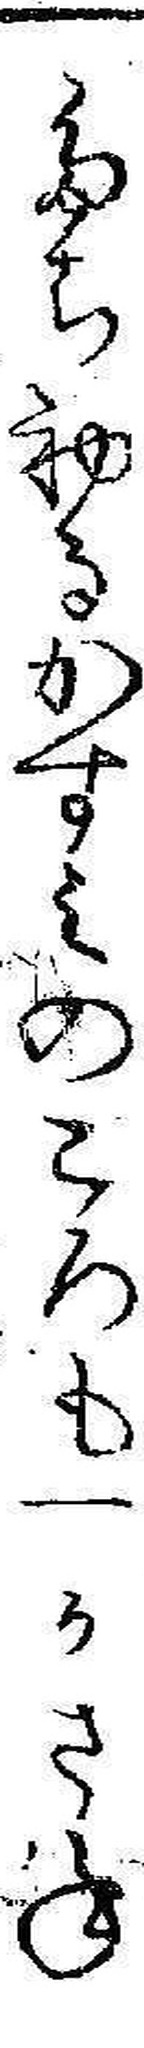たち初るかすみのころも一かさね
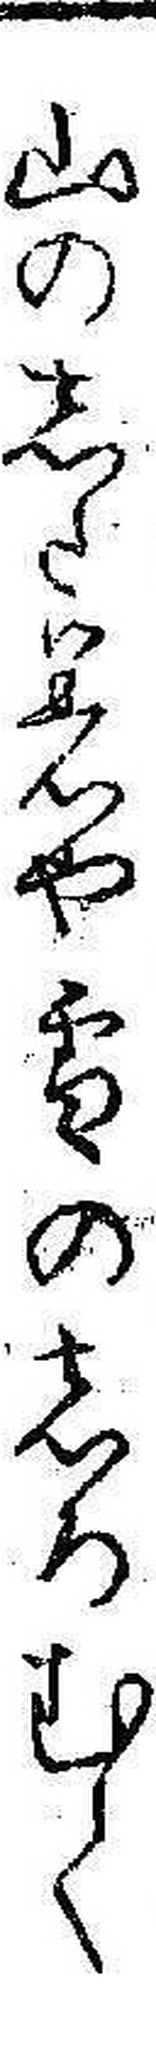山のした着や雪のしろむく
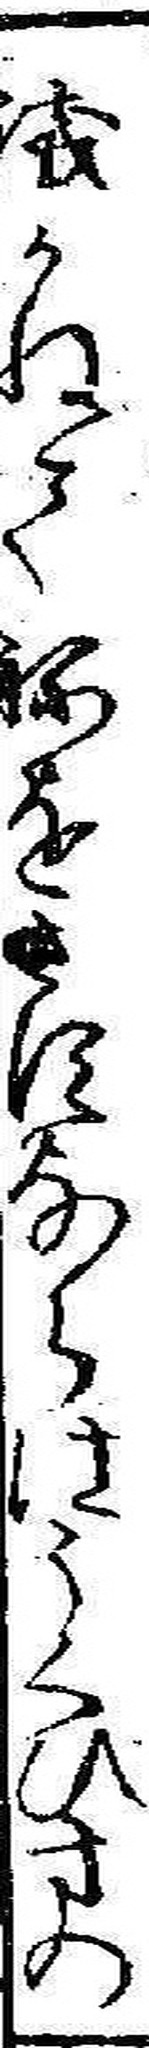銭かねてねをさきならはうくひすの
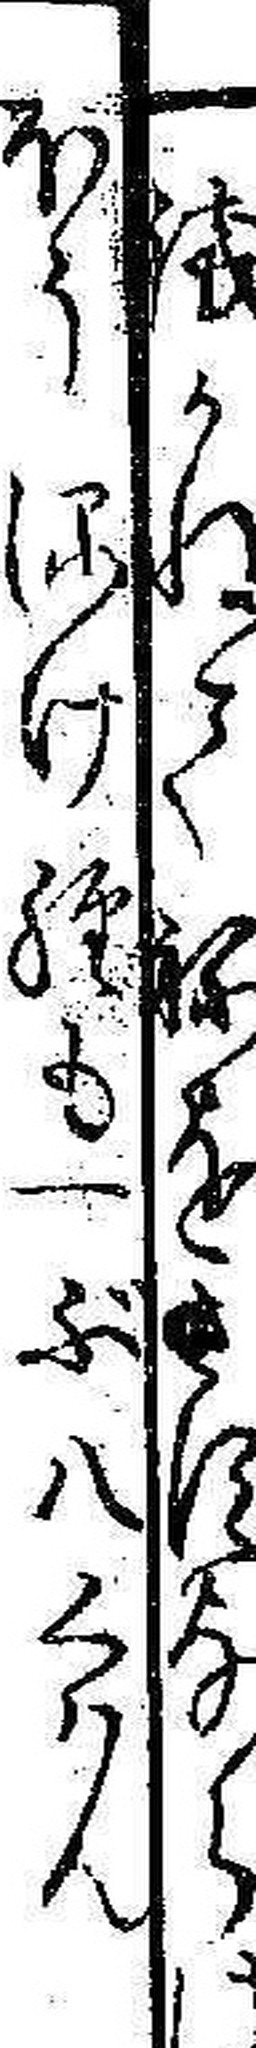ほうほけ経も一ぶ八くりんん
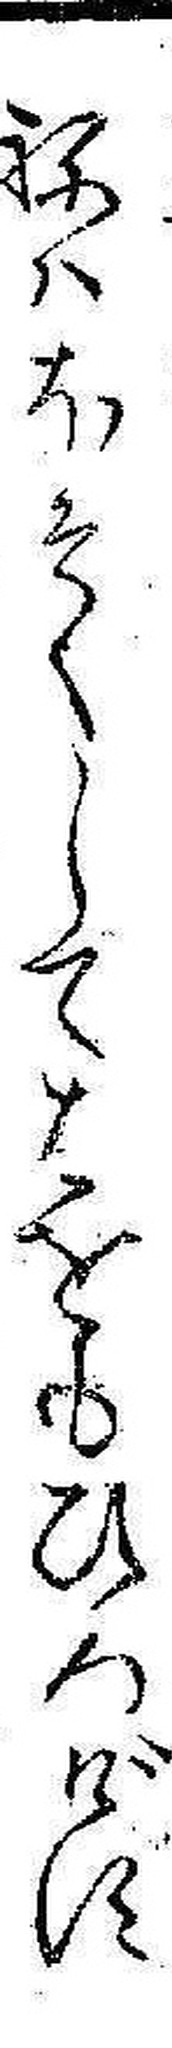ねはほそくしてをもひろげす
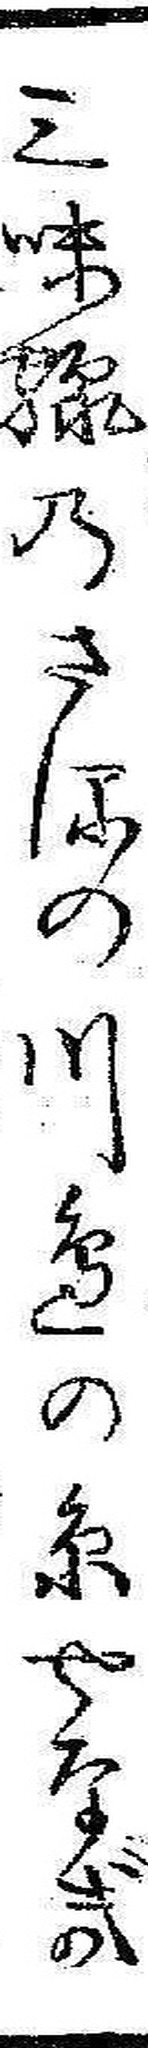三味線のさほの川辺の糸やなぎの
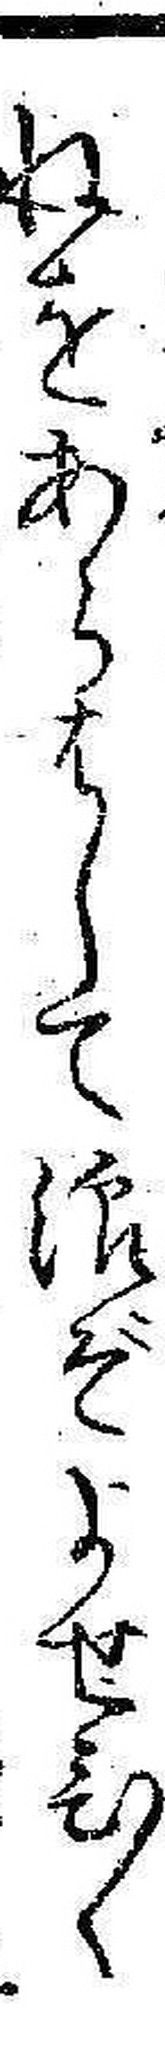ねをあらはして浪ぞよせひく
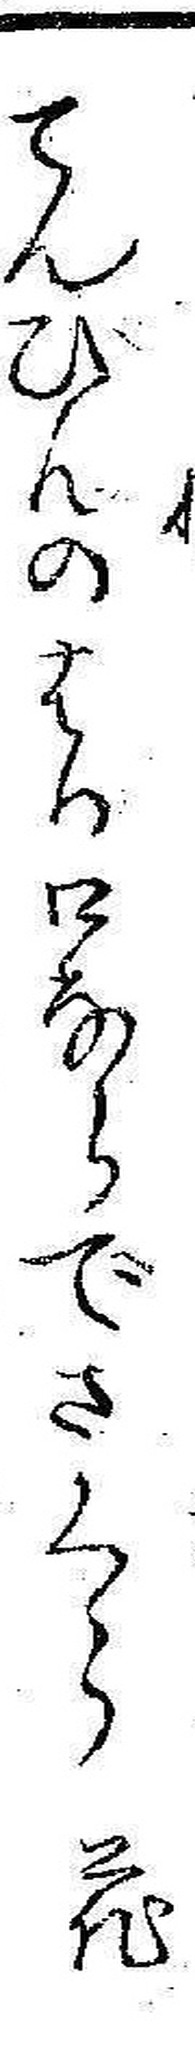てんびんのはり口ならでさくら花
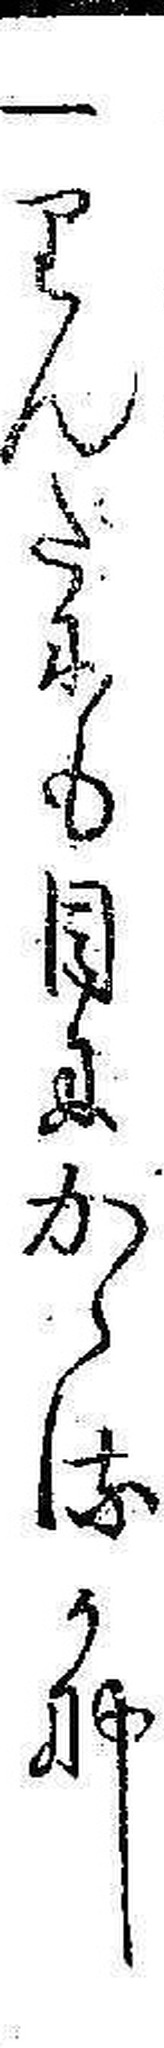一りんたにも目にかゝるうなし

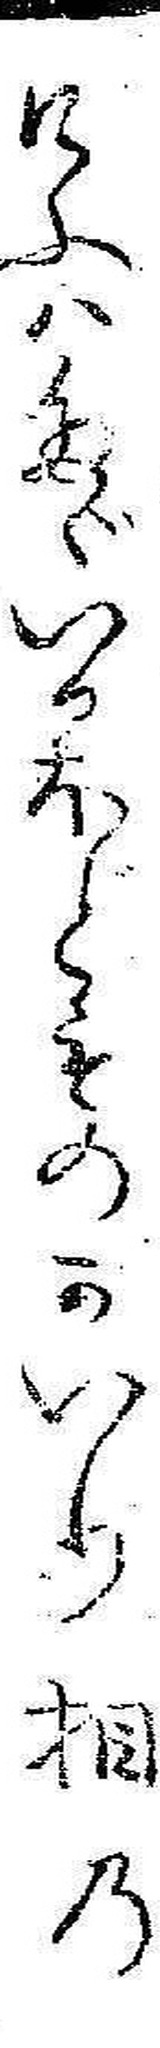けふはたゞいかほどものかいり相の
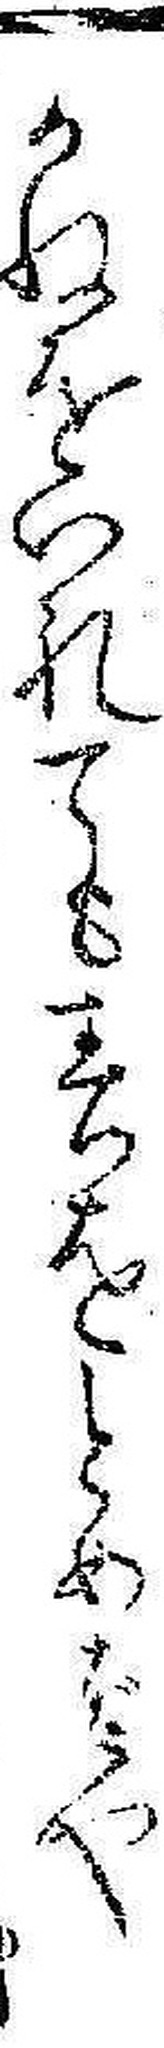かねをいれても春をとめばや
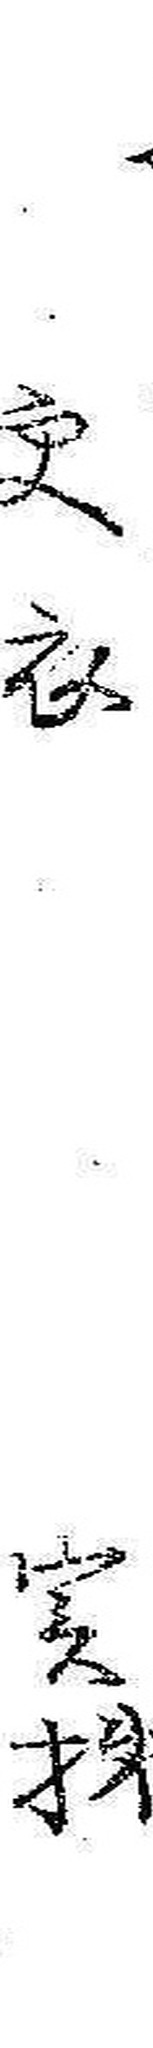更衣実柿
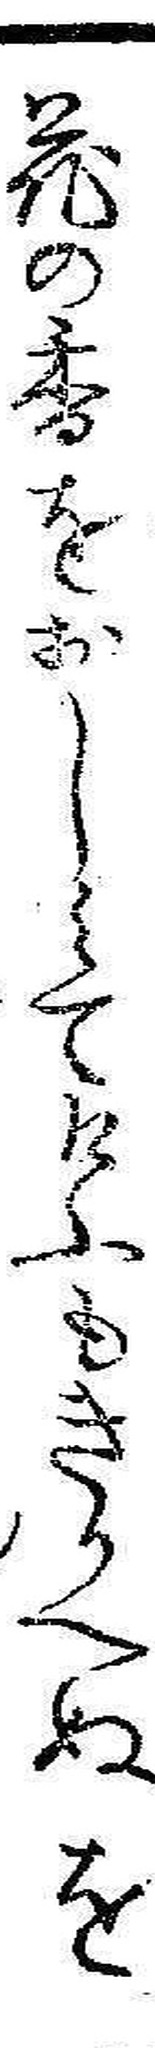花の香をおしみてけふもきかへぬを
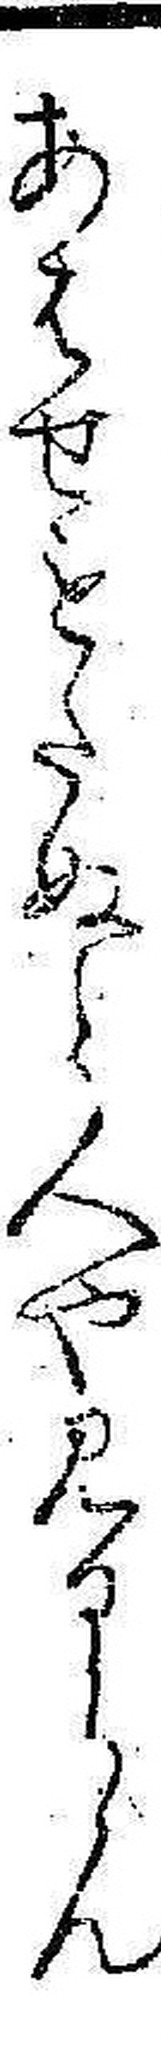あはせもたぬと人や見るらん
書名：狂哥はまのきさご
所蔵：国文学研究資料館
